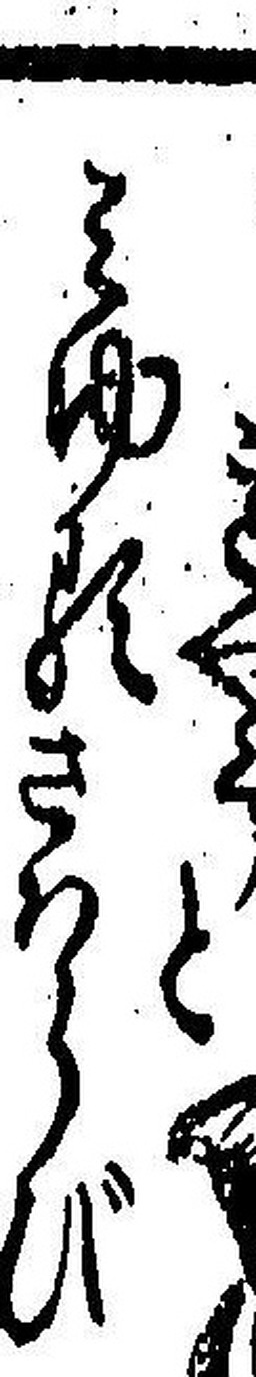みゆるさはらび
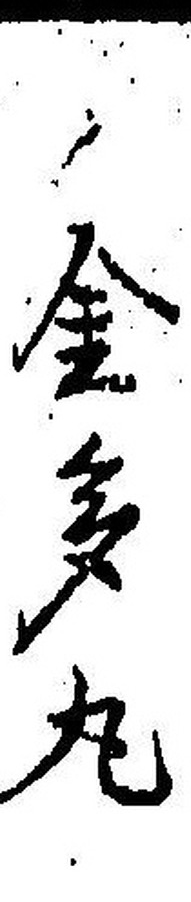金多丸
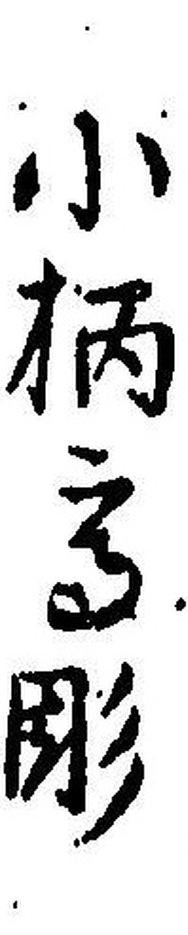小柄高彫
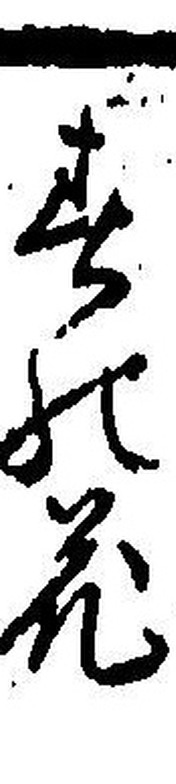春の花
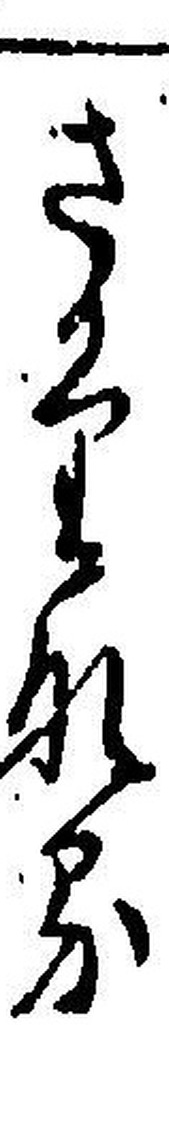さかりなる
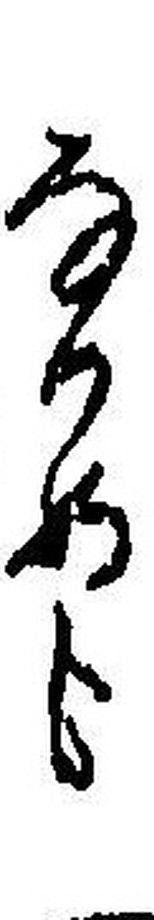なかめも
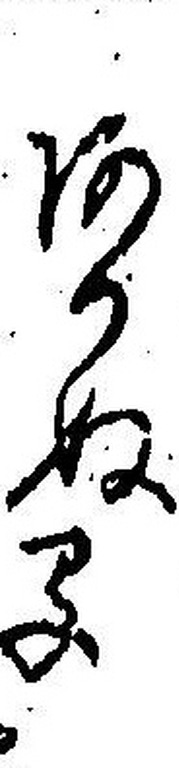あかぬ子
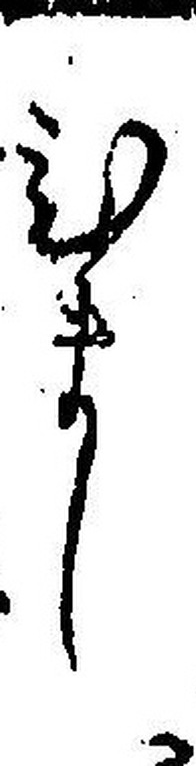ひまし
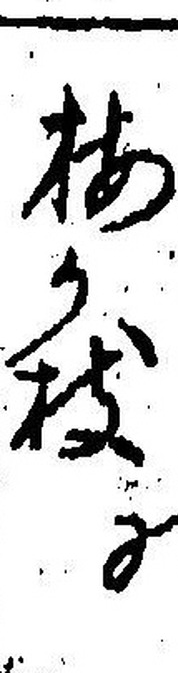梅か枝
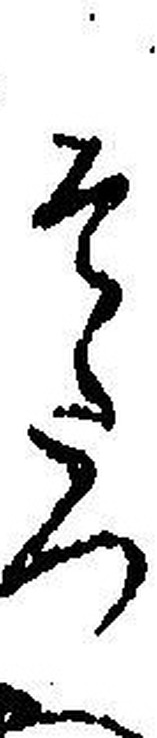そたつ
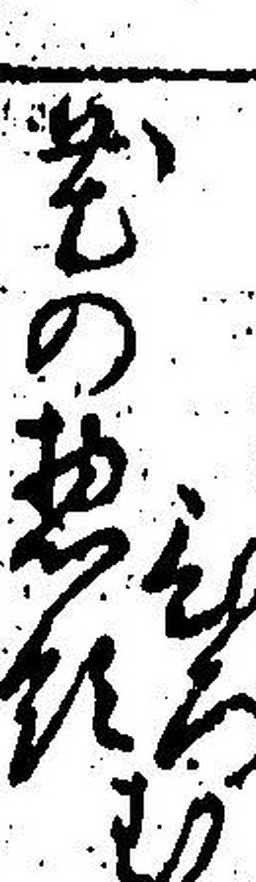花の惣領

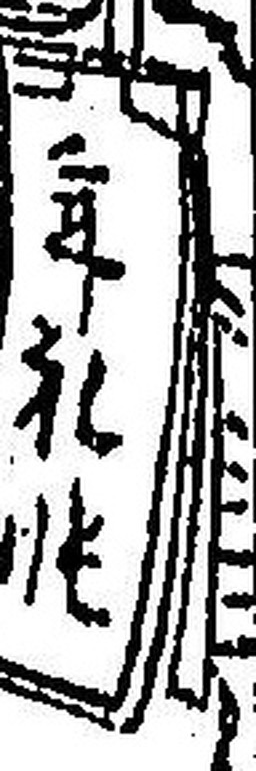年礼帳
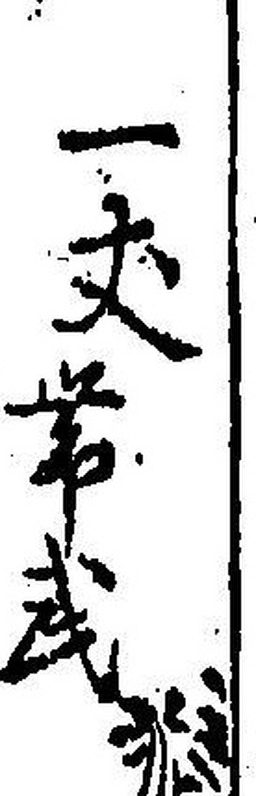一丈帯武
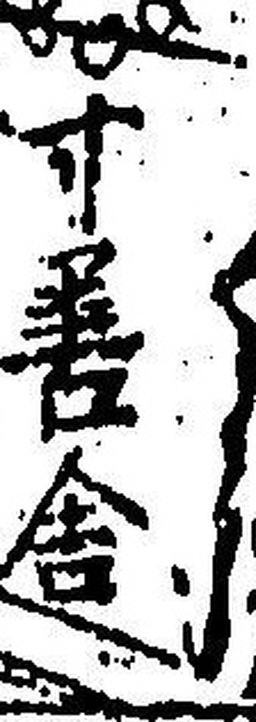寸善舎
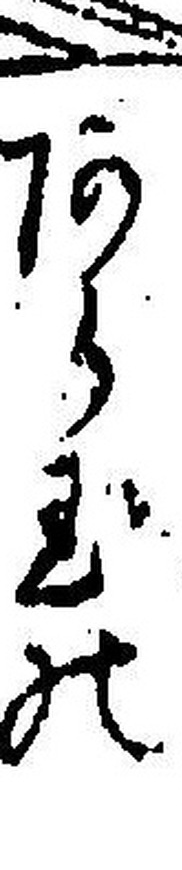あら玉の
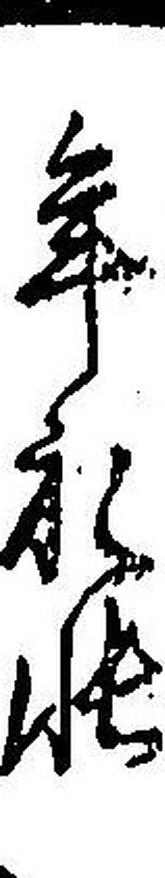年礼帳
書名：どうれ百人一首 / 鹿都部真顔(狂歌堂)編
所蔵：東京大学総合図書館 General Library in the University of Tokyo, JAPAN
